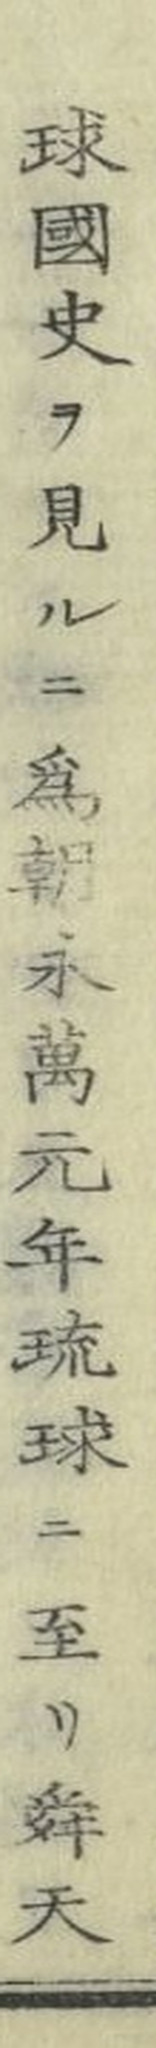球國史ヲ見ルニ爲朝永萬元年琉球ニ至リ舜天
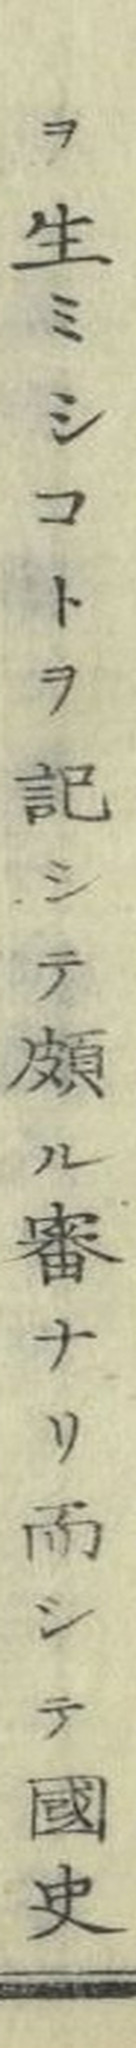ヲ生シコトヲ記シテ頗ル審ナリ而シテ國史
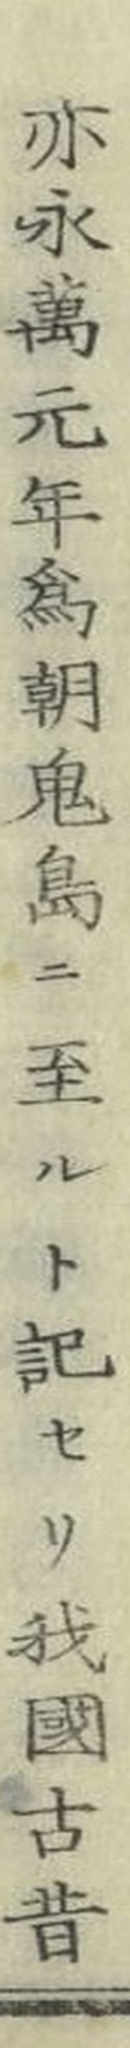亦永萬元年爲朝鬼島ニ至ルト記レリ我國古昔
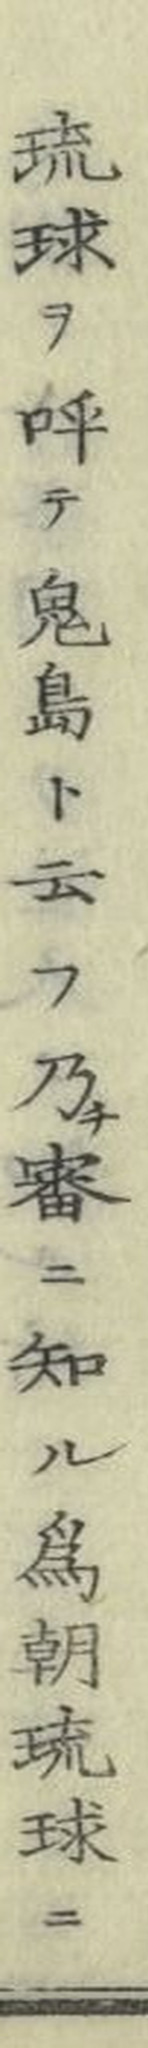琉球ヲ呼テ鬼島ト云乃審ニ知ル爲朝琉球ニ
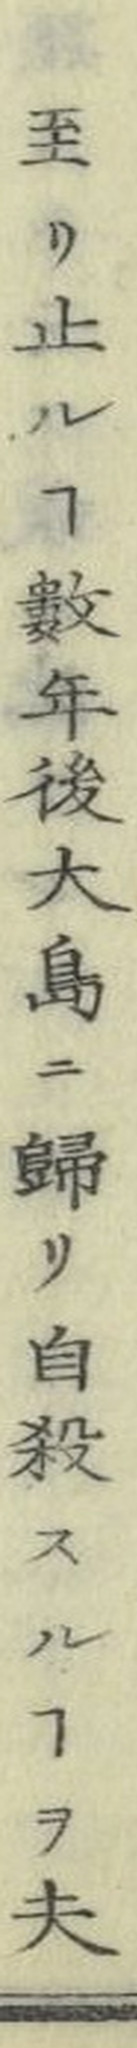至リ止ルコト數年後大島ニ歸リ自殺スルコトヲ夫
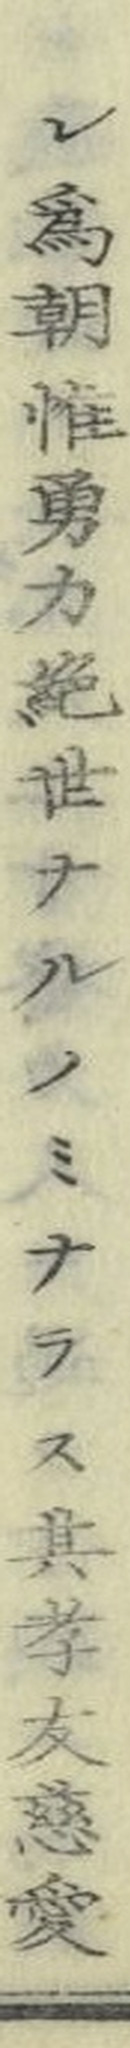レ爲朝惟勇力絕世ナルノミナラス其孝友慈愛
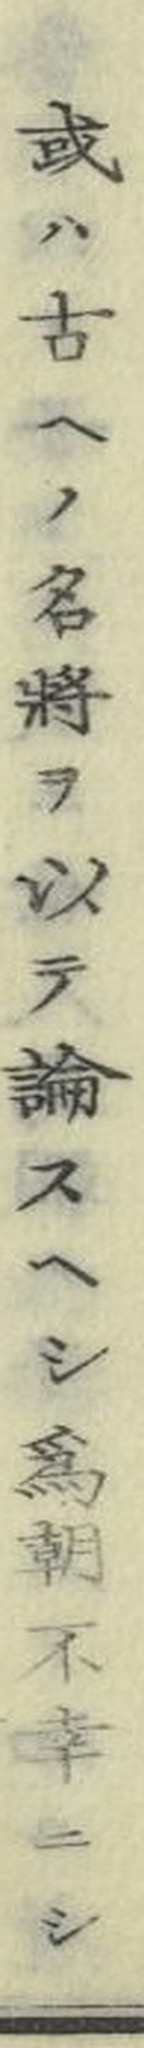或ハ古ヘノ名將ヲ以テ論スヘシ爲朝不幸ニシ
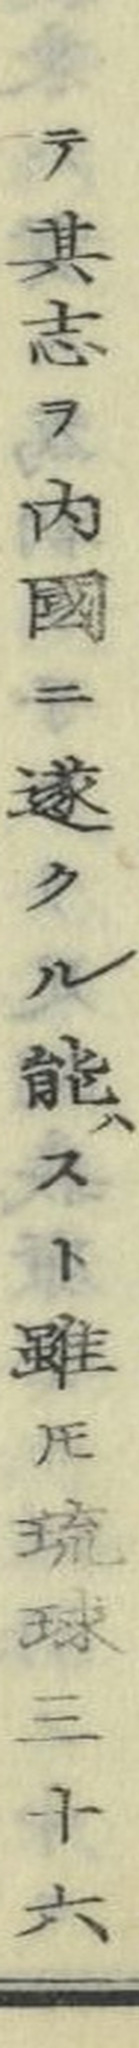テ其志ヲ内國ニ遂クル能スト雖トモ琉球三十六
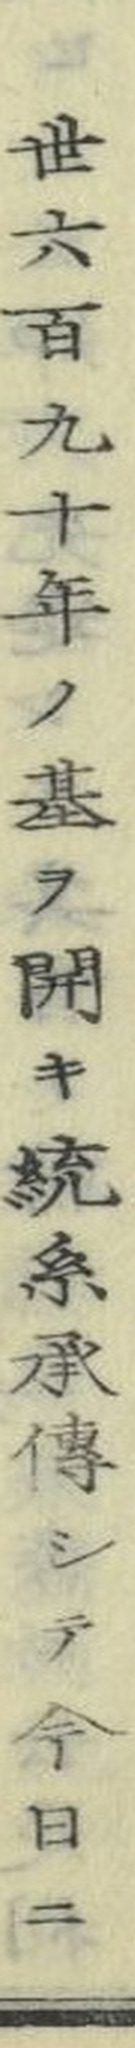世六百九十年ノ基ヲ開キ統系承傳シテ今日ニ
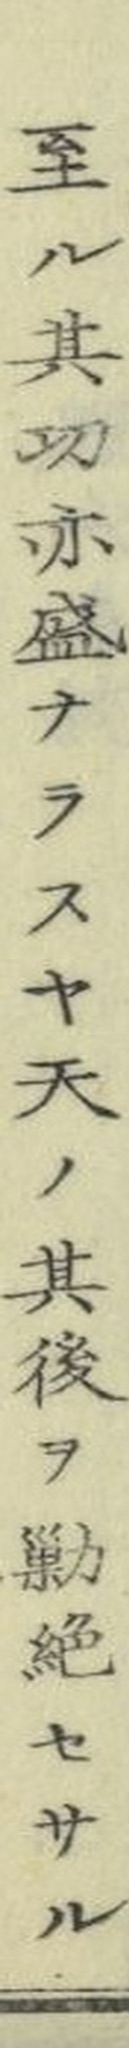至ル其功亦盛ナラスヤ天ノ其後ヲ勦絕セサル
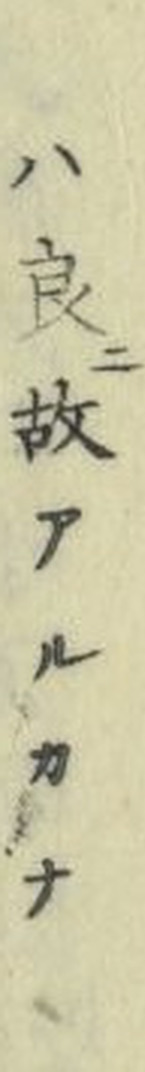ハ良故アルカナ

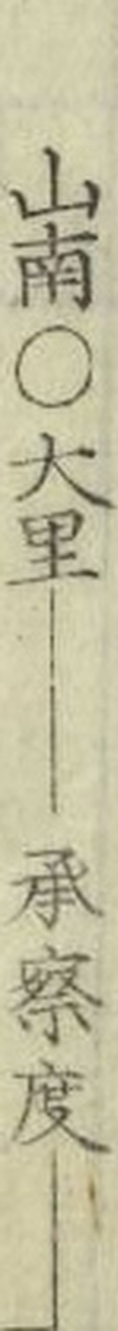山南○大里承察度
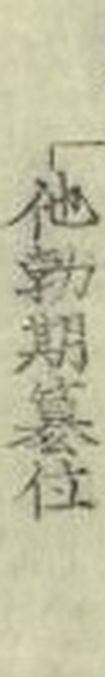他勃期簒位

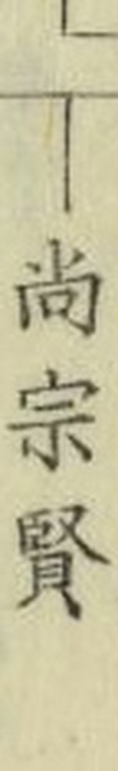尚宗賢
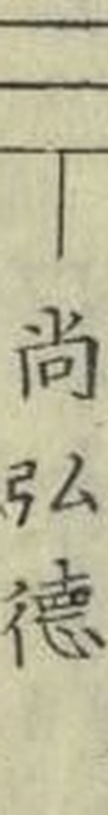尚弘才
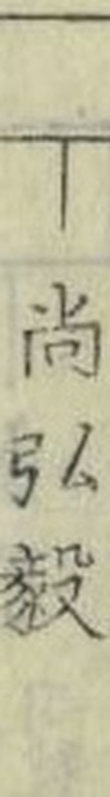尚弘才
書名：琉球藩史 一之巻
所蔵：University of the Ryukyus Library
